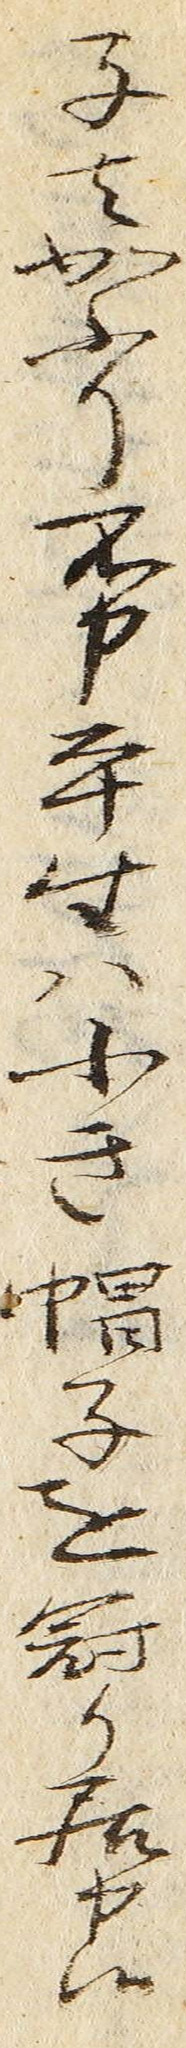子はかふり不申平生は小き帽子を冠り居申候
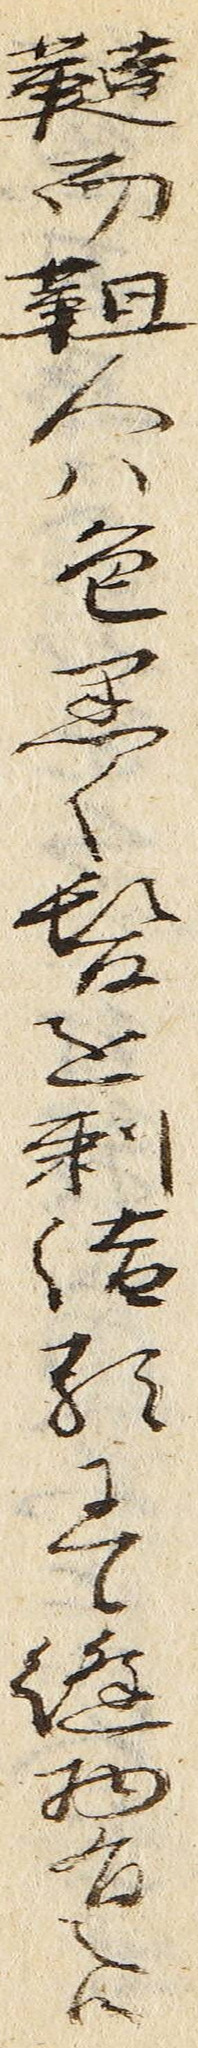韃而靼人は色黒く髪を刺絹類にて縫物有之候
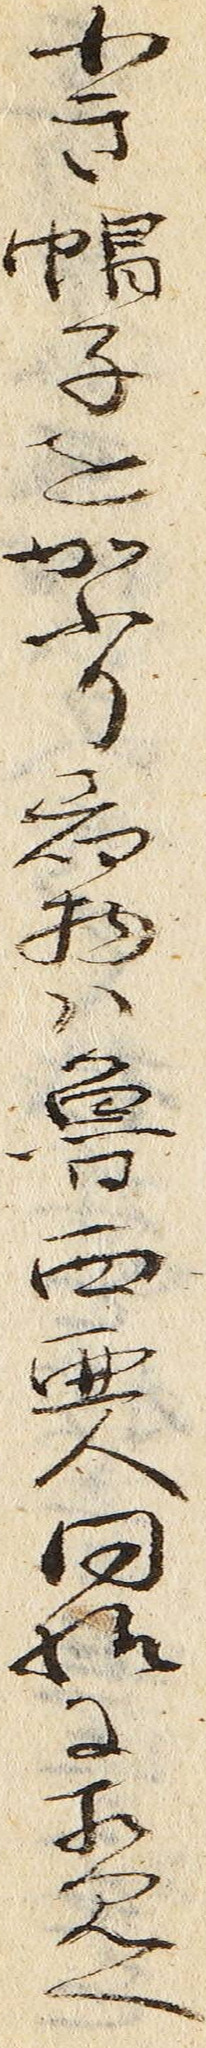小き帽子をかふり着物は魯西亜人同様に相見へ
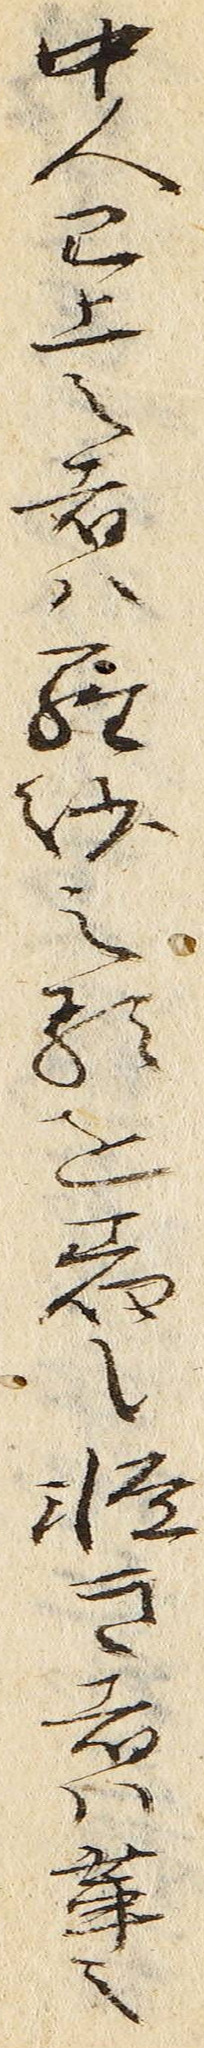中人已上之者は羅紗之類を着し軽き者は革之
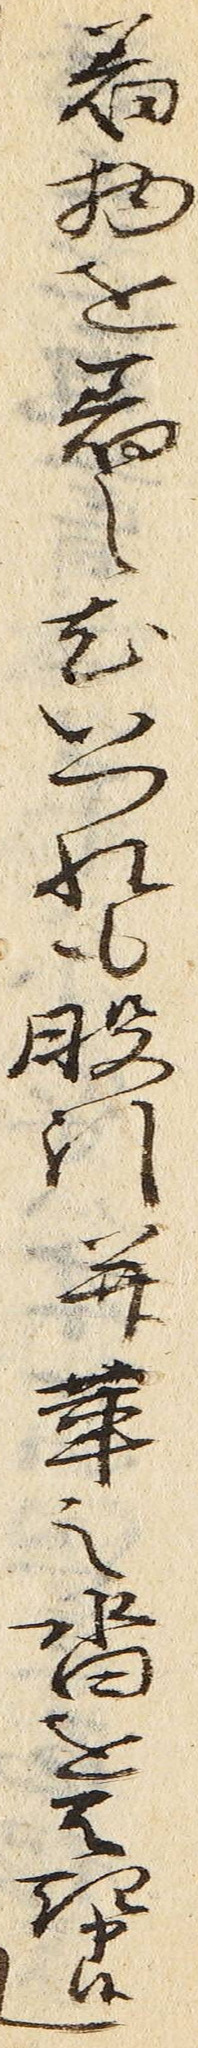着物を着し尤いつれも股引并革之沓をはき申候」
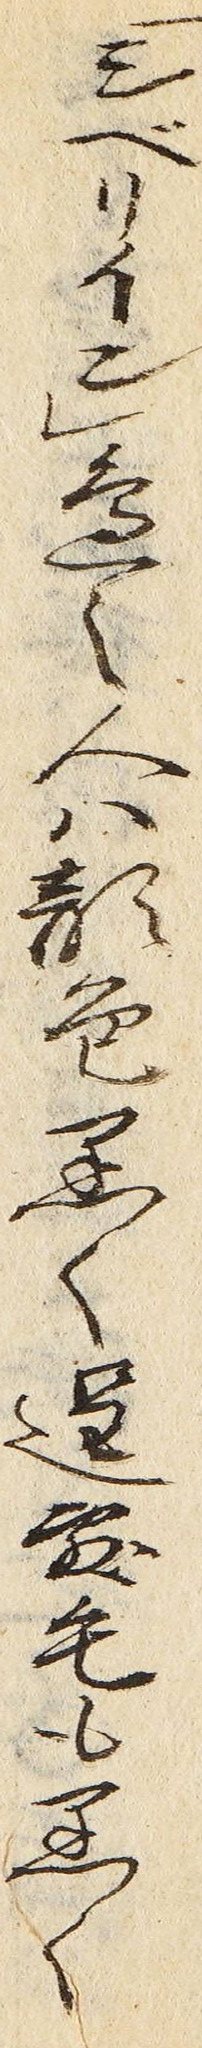「シベリイン」辺之人は顔色黒く逞敷毛も黒く
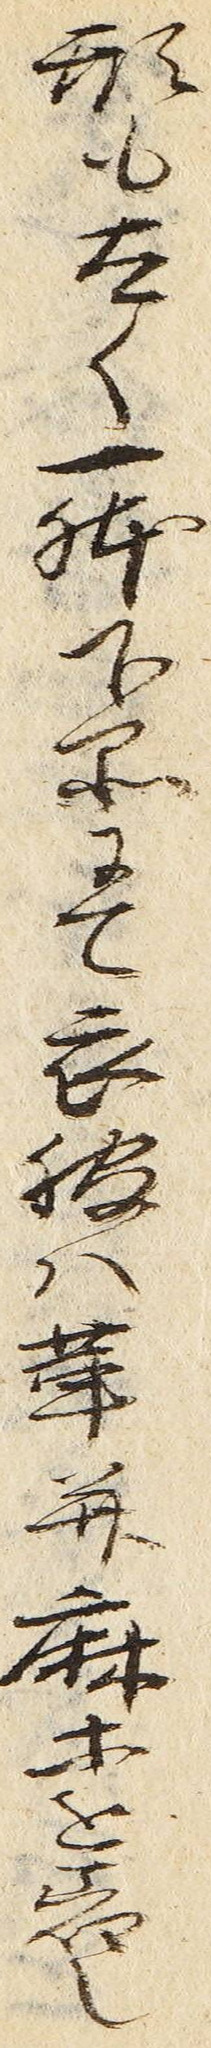形も太く一体下品にて衣服は革并麻等を着し
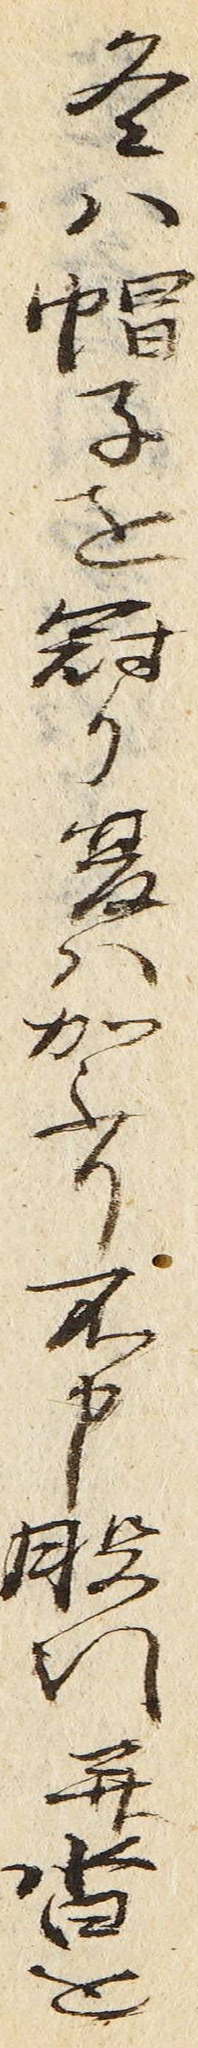冬は帽子を冠り夏はかふり不申股引并沓を
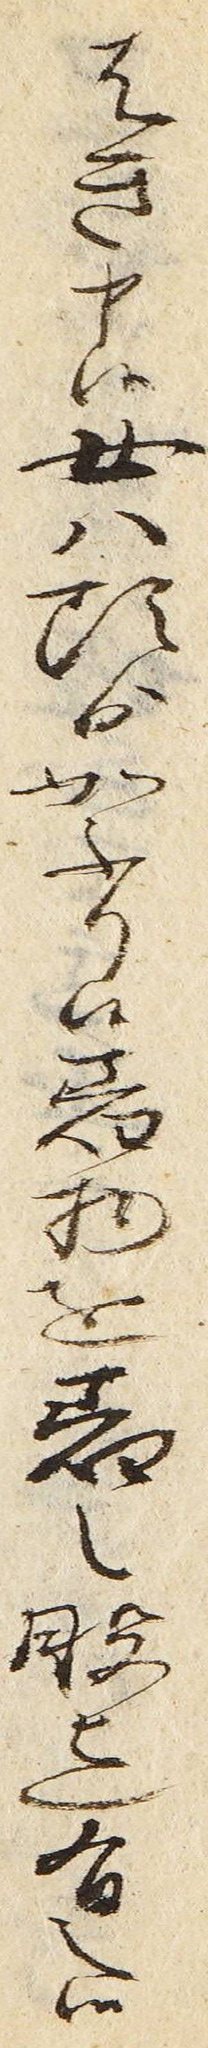はき申候女は頭ゟかふり候着物を着し股迄有之候
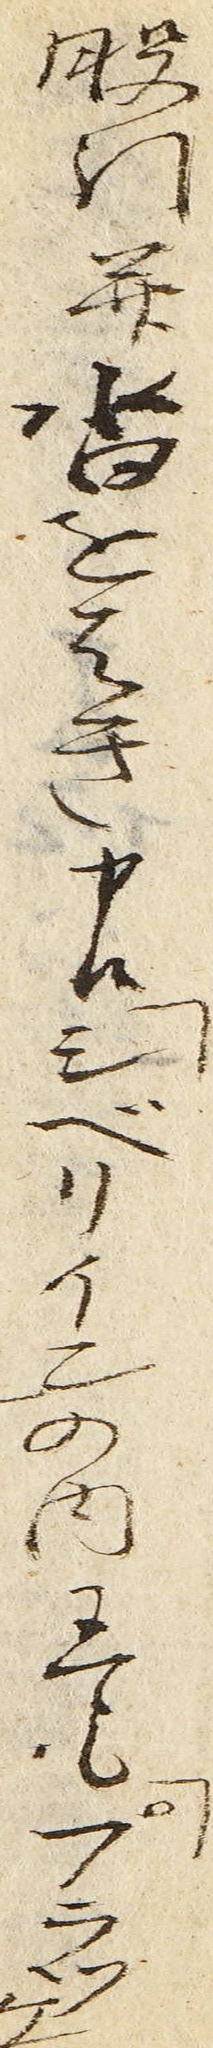股引并沓をはき申候「シベリイン」の内にても「プラツケ」
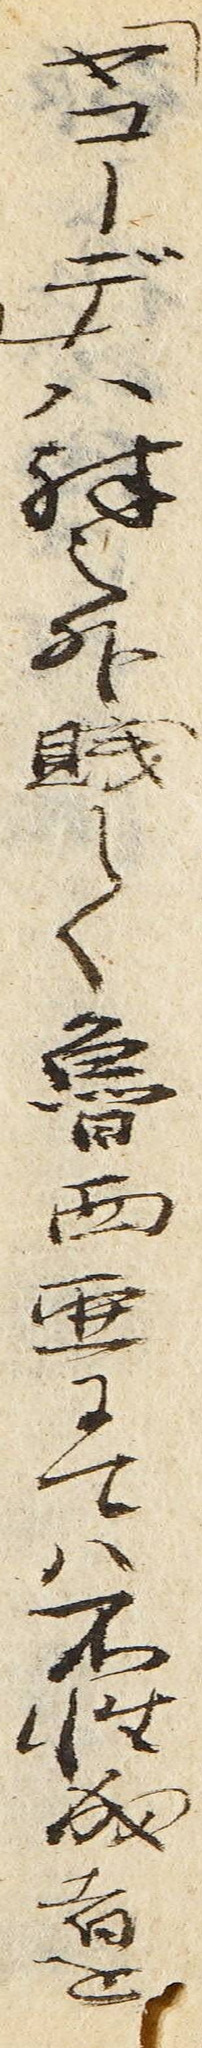「ヤコーデ」は殊之外賤しく魯西亜にては不性成者を
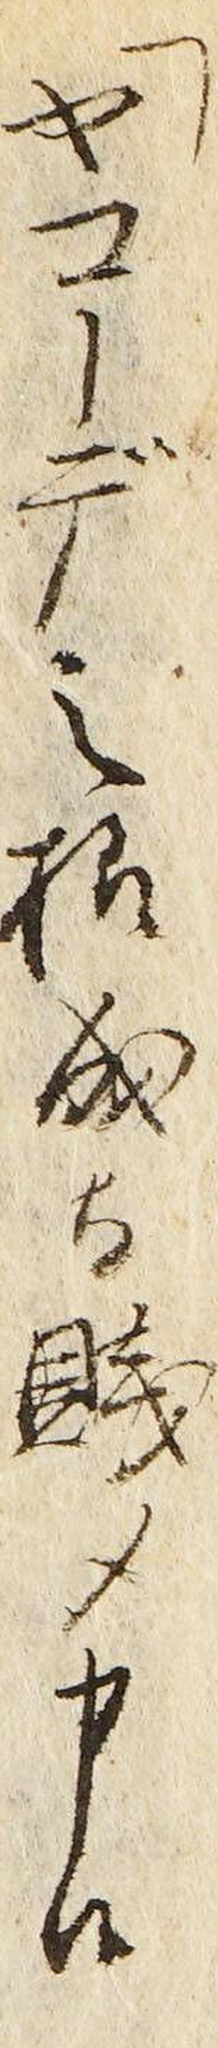「ヤコーデ之様成と賤メ申候」
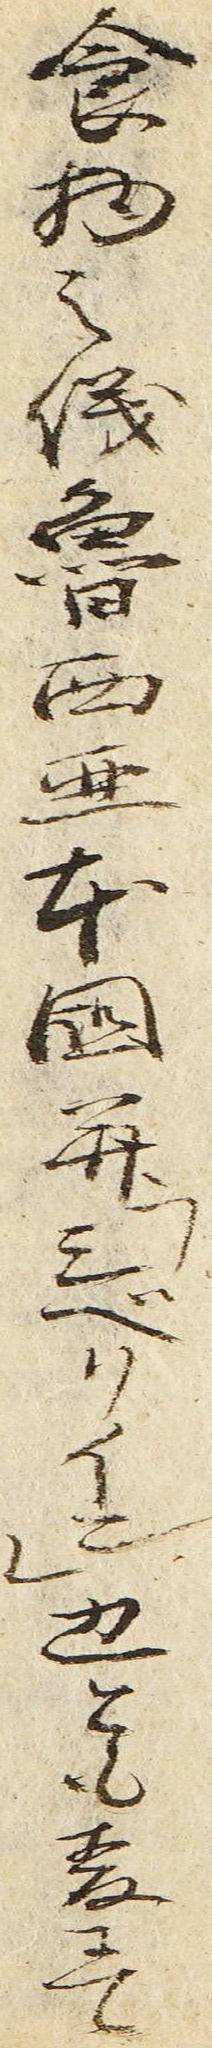食物之儀魯西亜本国并「シベリイン」辺とも麦にて
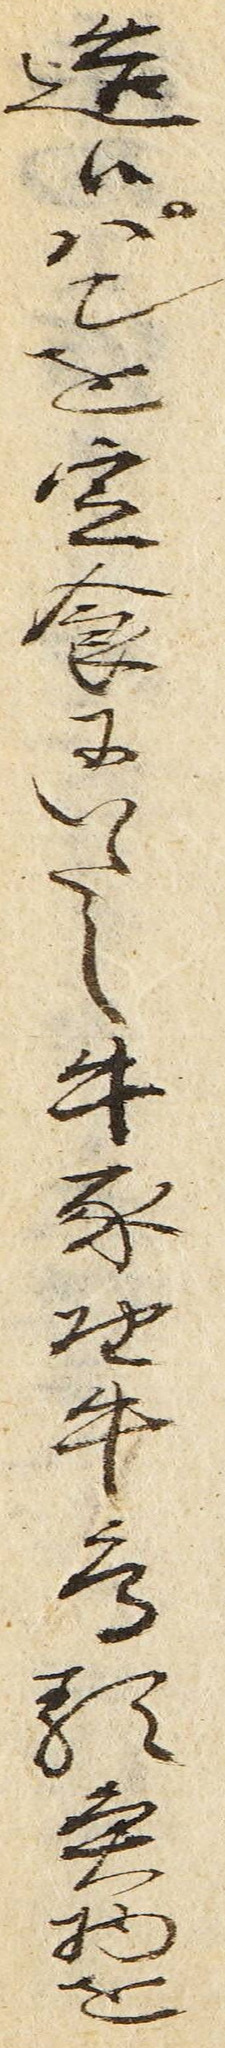造候パンを定食にいたし牛豕野牛鳥類魚物を

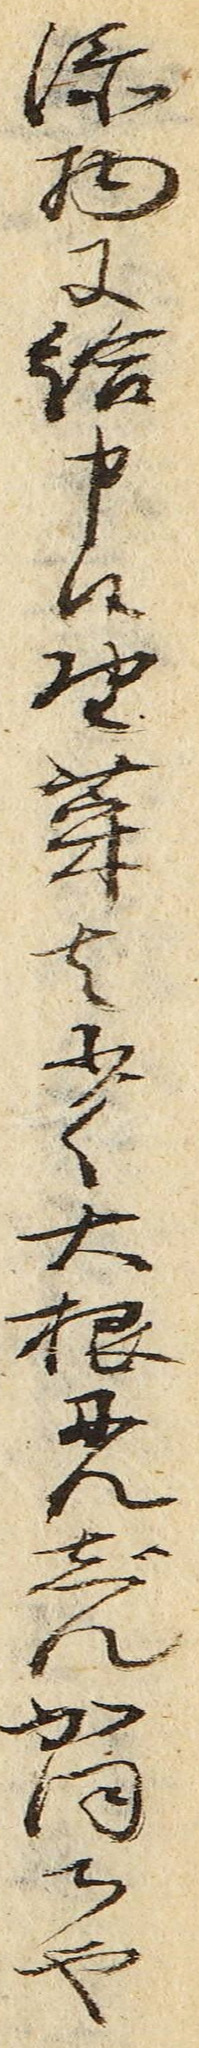添物に給申候野菜は少く大根にんじんかほちや
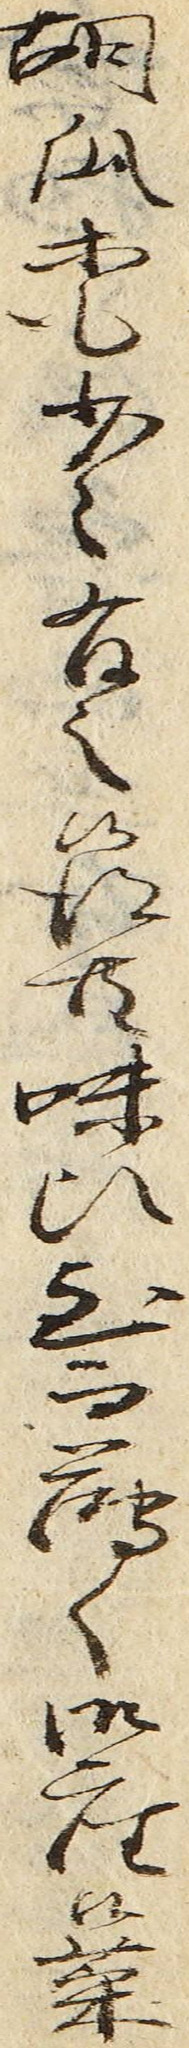胡瓜等も少々有之候得共味ひ至て薄く御座候菜
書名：漂民後記
